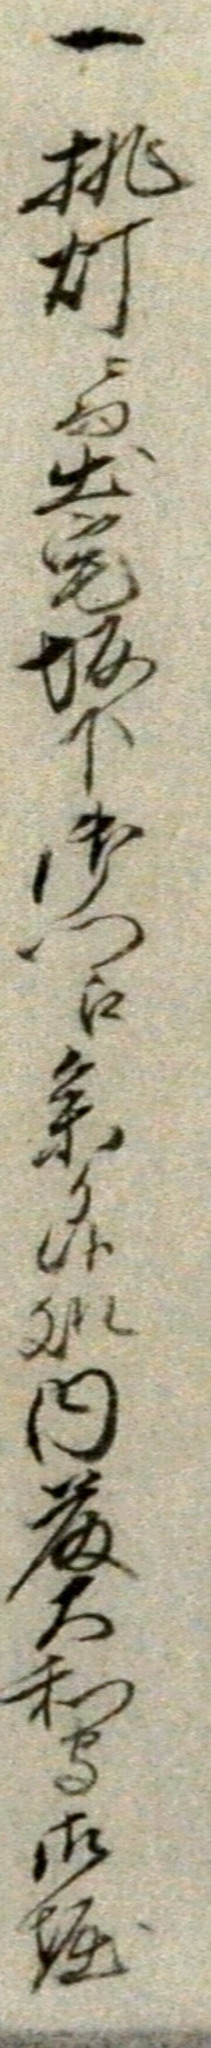一挑灯ニ而出宅坂下御門え参り候処内藤大和守御堀
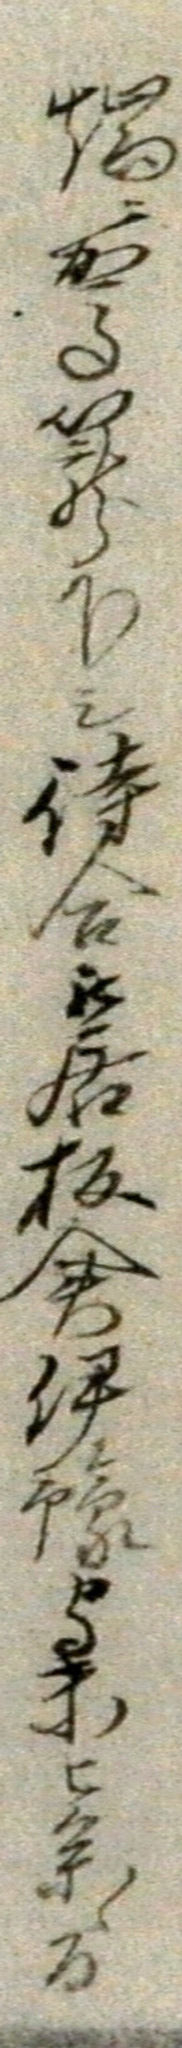場ニ駕籠下シ待合被居板倉伊豫守未被参候而
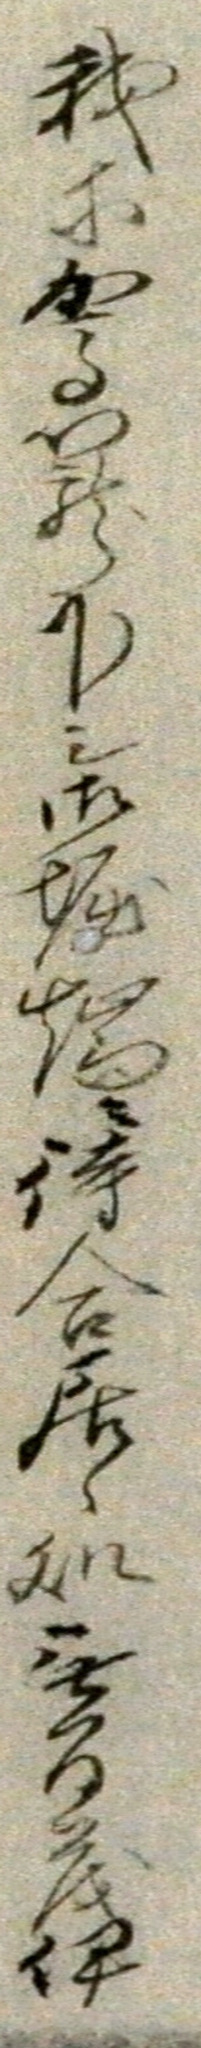我等駕籠下シ御堀場ニ待合居候処無間も伊
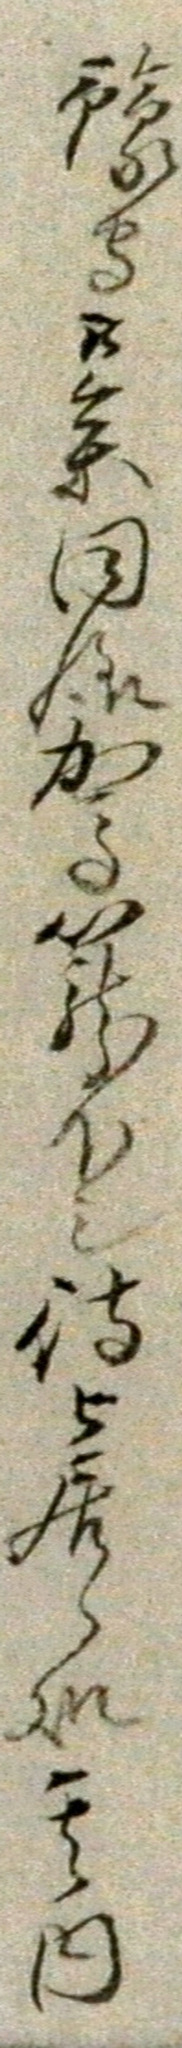豫守被参同様駕籠下シ待被居候処其内
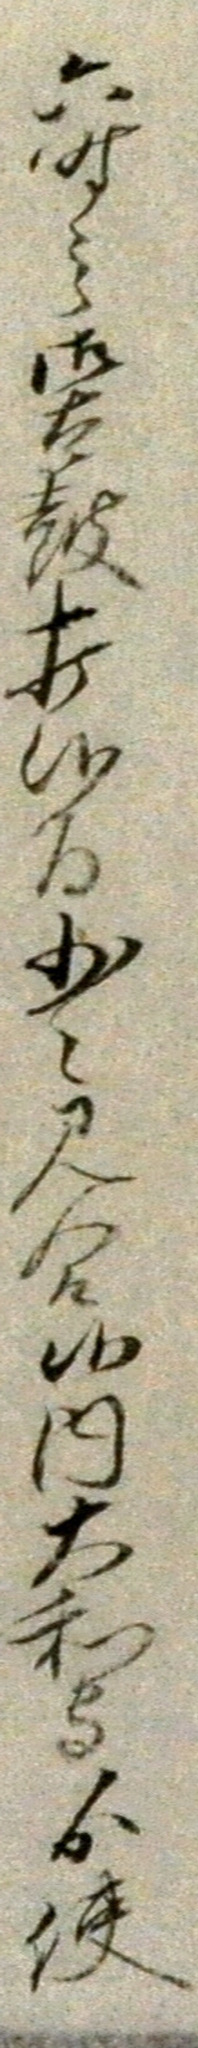六時之御太鼓打候間少々見合候内大和守ゟ使
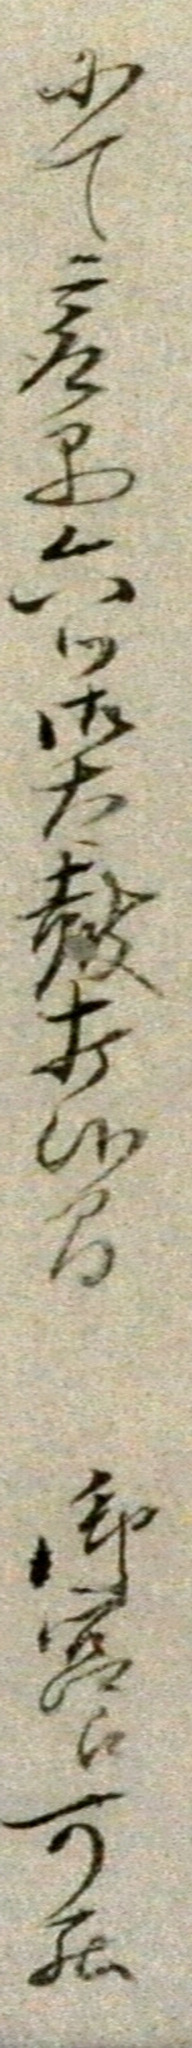にて最早六ツ御太鼓打候間御宮え可罷
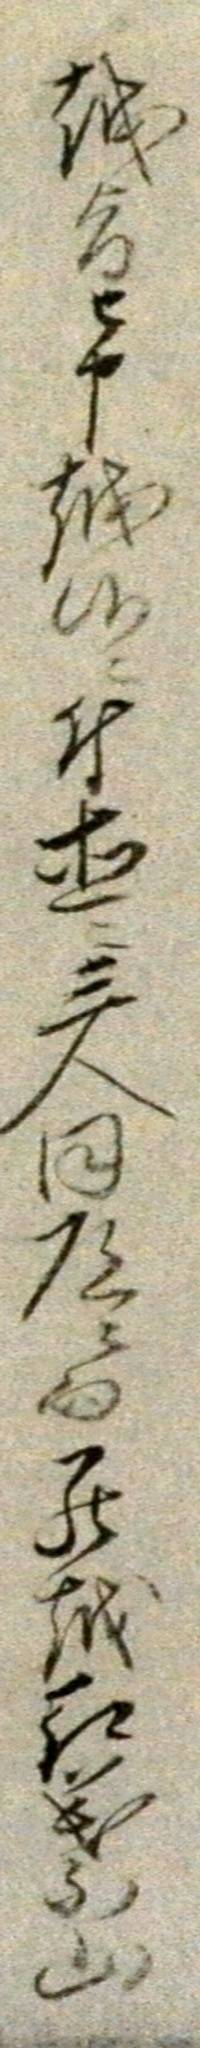越旨被申越候ニ付直ニ三人同道ニ而罷越紅葉山
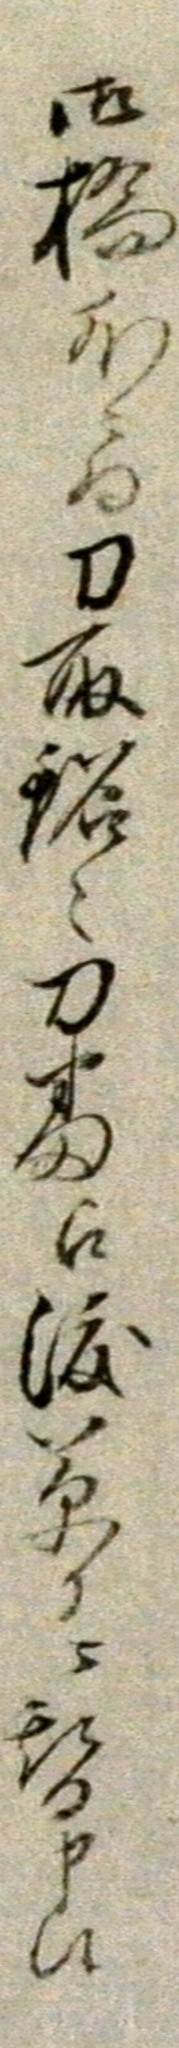御橋外ニ而刀取銘々刀番え渡草りニ替申候
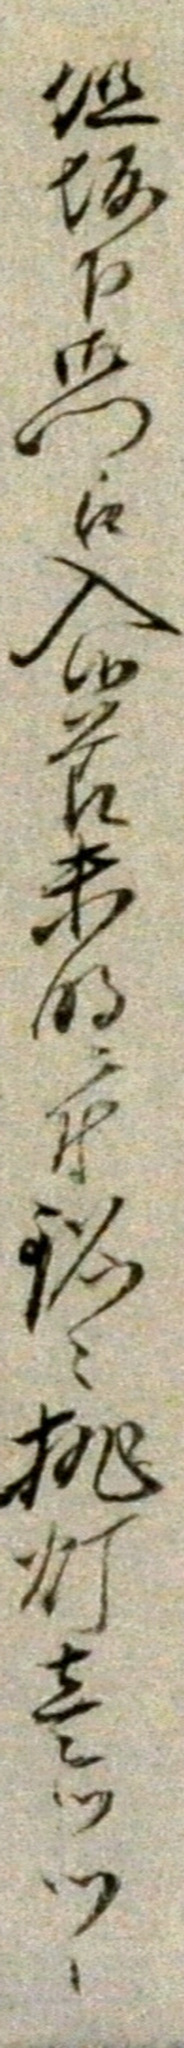但坂下御門え入候節未明ニ付銘々挑灯壱ツツヽ
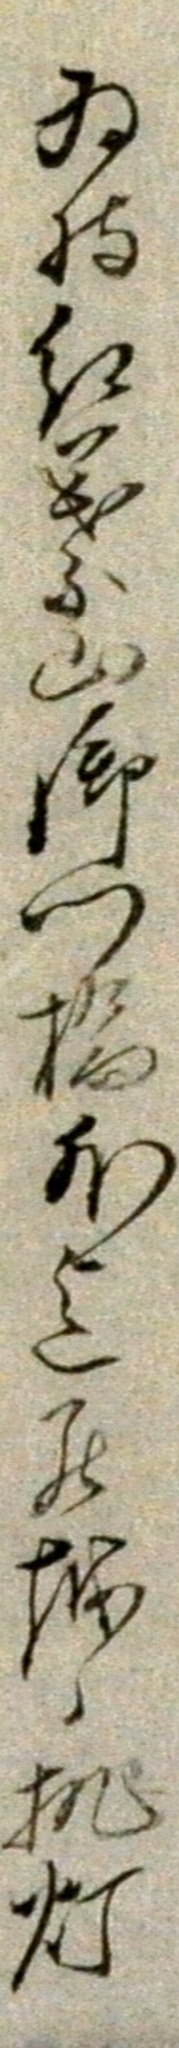為持紅葉山御門橋外迄罷越候挑灯
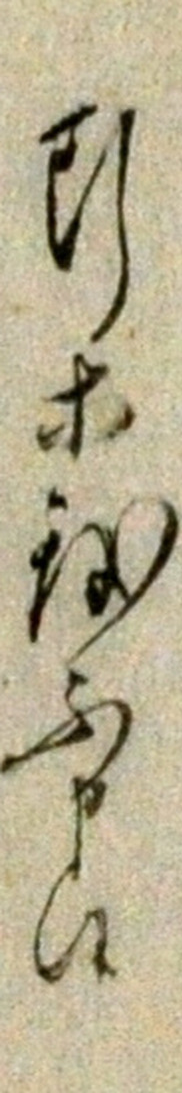断等致不申候
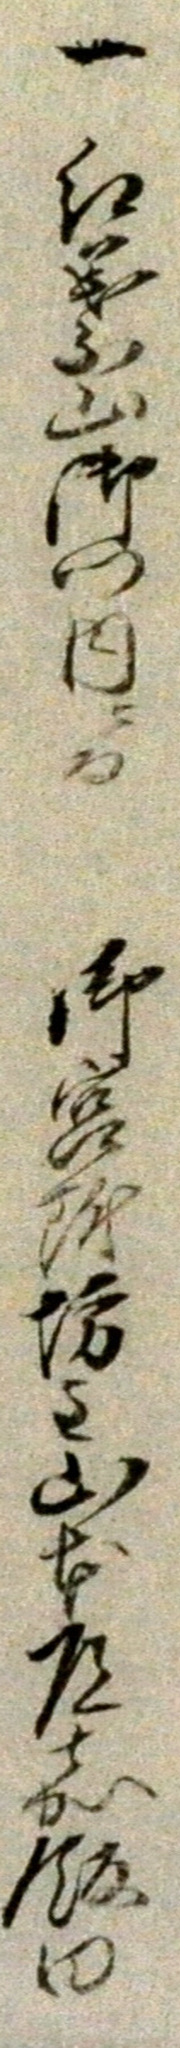一紅葉山御門内ニ而御宮附坊主山本道嘉飯田
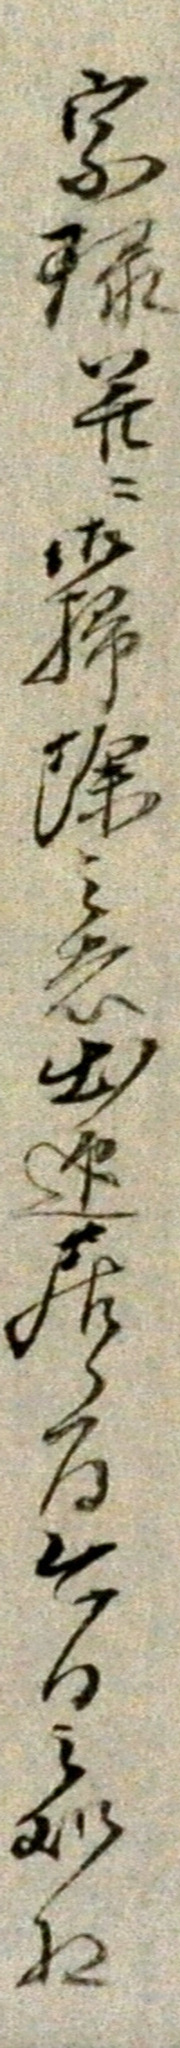宗録并ニ御掃除之者出迎居候間今日之処相
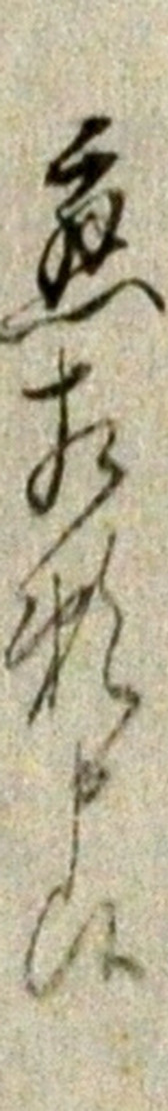応相頼申候
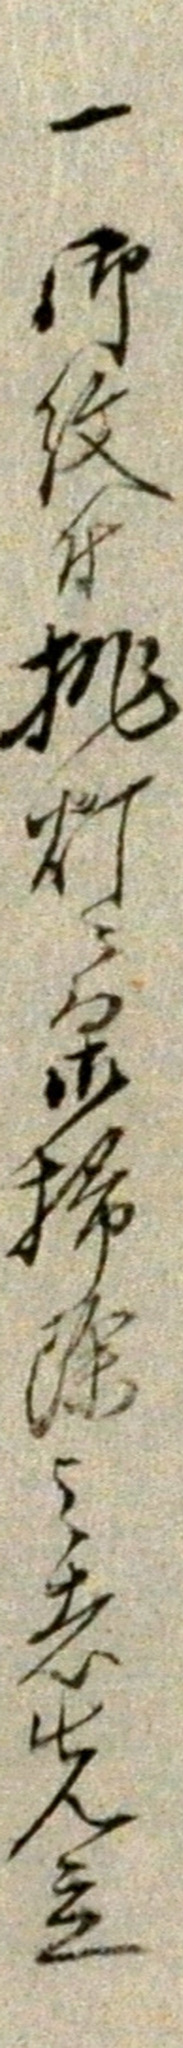一御紋付挑灯ニ而御掃除之者先立
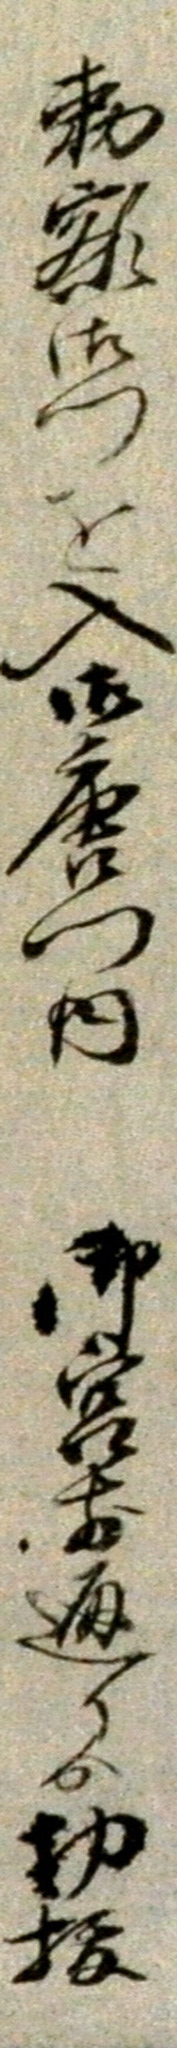勅願御門を入御唐門内御宮前通りゟ切抜
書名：御鏡餅御用留（写）
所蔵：伊那市立高遠町図書館・合同会社AMANE
